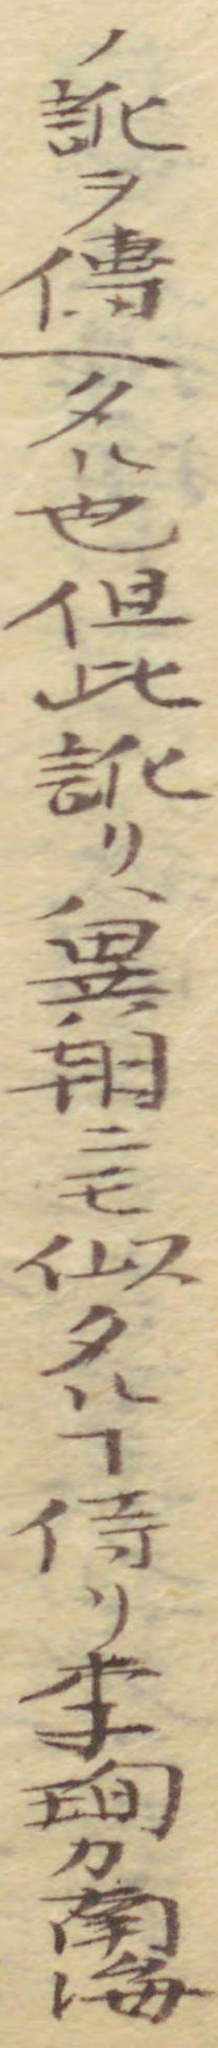ノ訛ヲ伝ヘタル也此訛リハ異朝ニモ似タルコト侍リ李珣カ南海
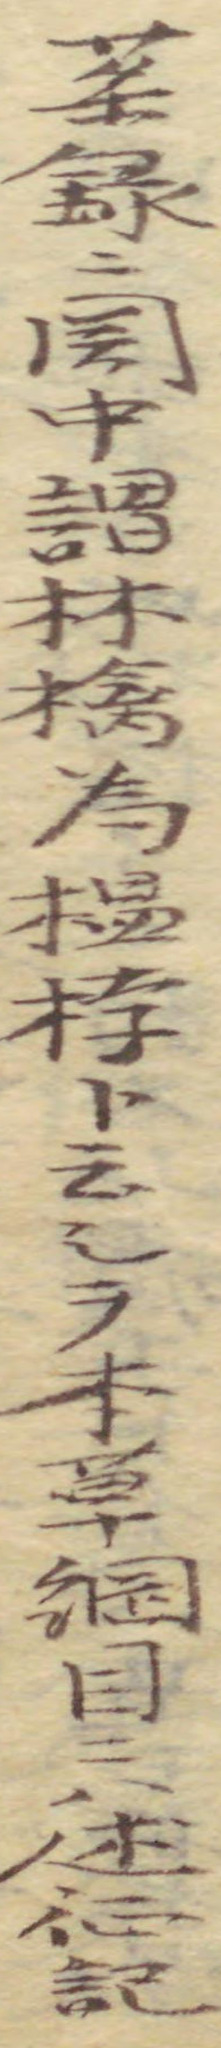薬録ニ関中謂林檎為榲桲ト云シヲ本草綱目ニハ述往記
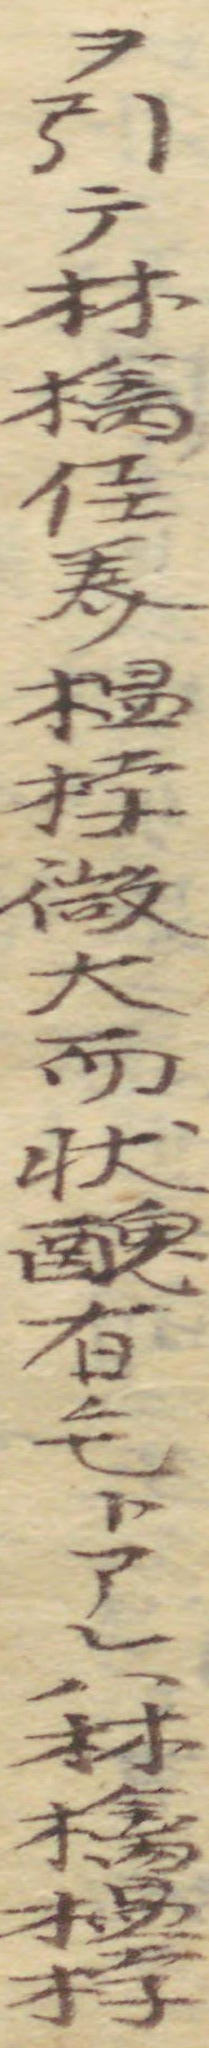ヲ引テ林檎佳美榲桲微大而状醜有毛トアレハ林檎榲桲
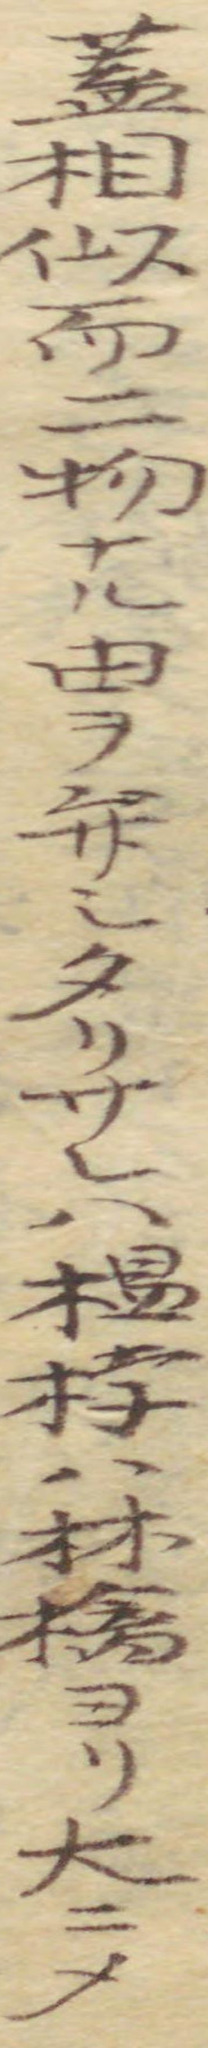蓋相似而二物ナル由ヲ弁シタリサレハ榲桲ハ林檎ヨリ大ニシテ
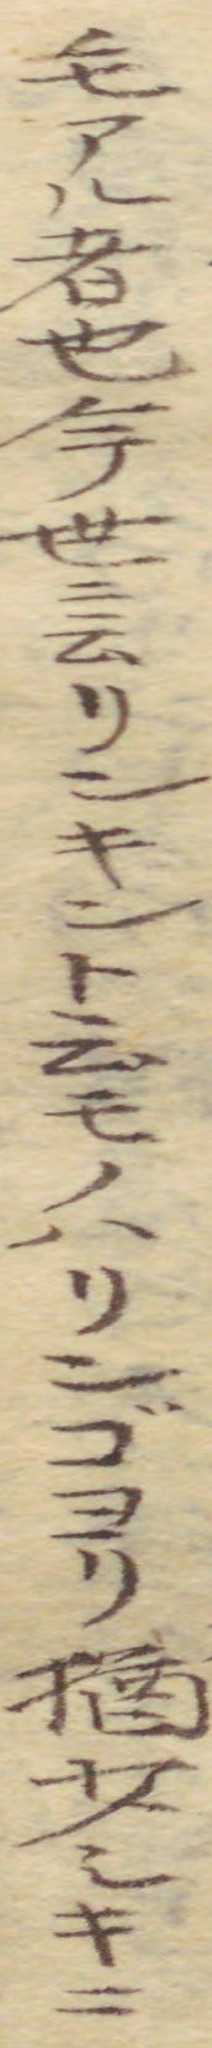毛アル者也今世ニ云リンキント云モノハリンゴヨリ猶少シキニ
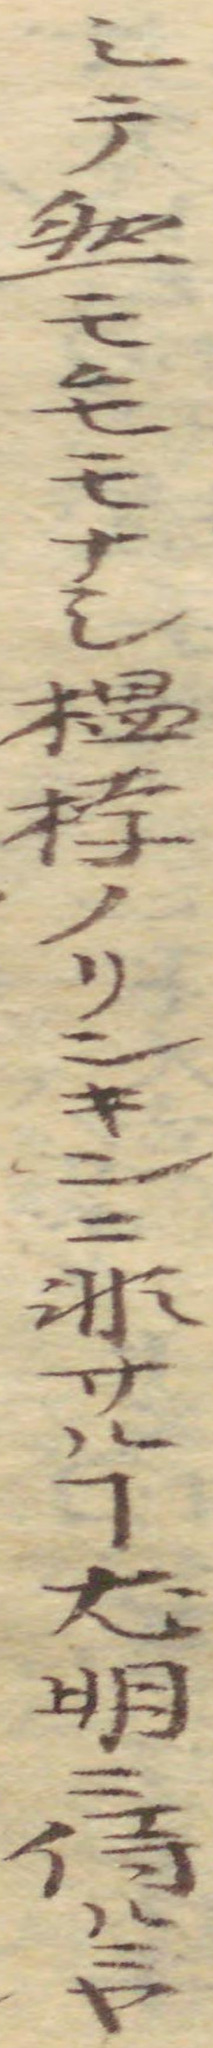シテ然モ毛モナシ榲桲ノリンキンニ非サルコト尤明ニ侍ルニヤ
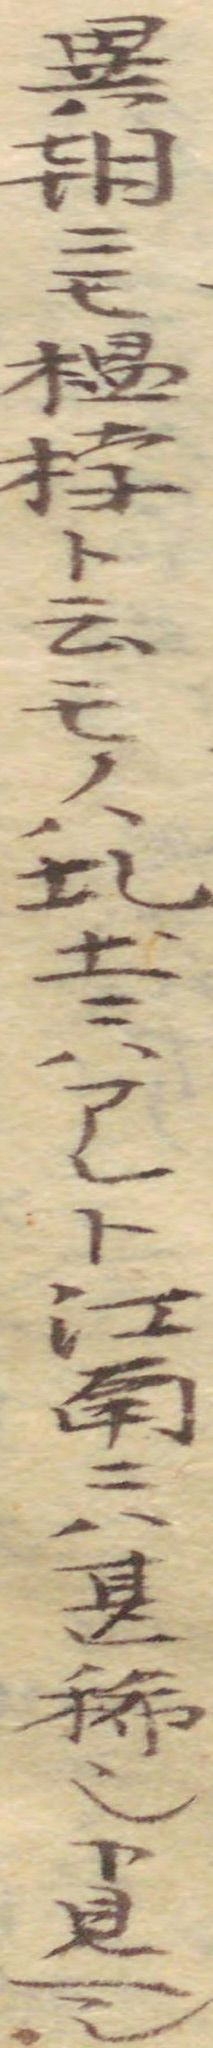異朝ニモ榲桲ト云モノハ圠土ニハアレト江南ニハ甚稀也ト見ヘシ
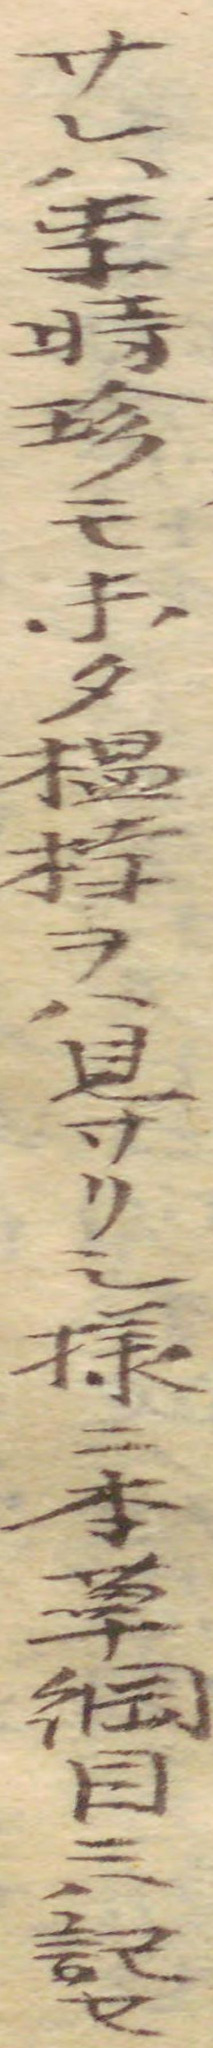サレハ李時珍モ未タ榲桲ヲハ見サリシ様ニ本草綱目ニハ記セ
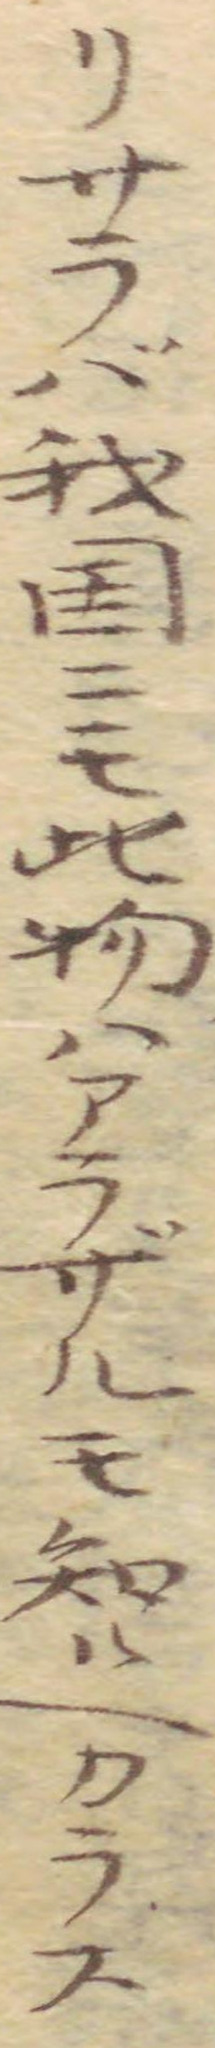リサレバ我国ニモ此物ハアラザルモ知ルヘカラス
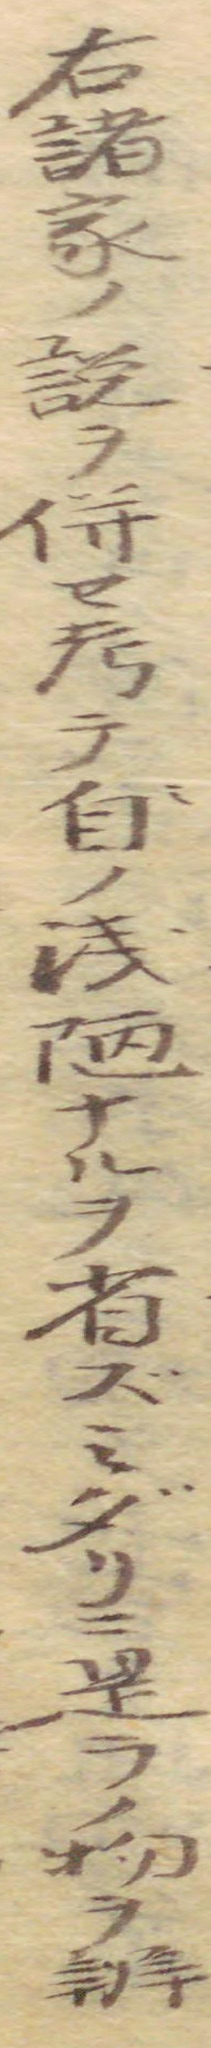右諸家ノ説ヲ併セ考テ自ノ浅陋ナルヲ省ズミダリニ是ラノ物ヲ弁
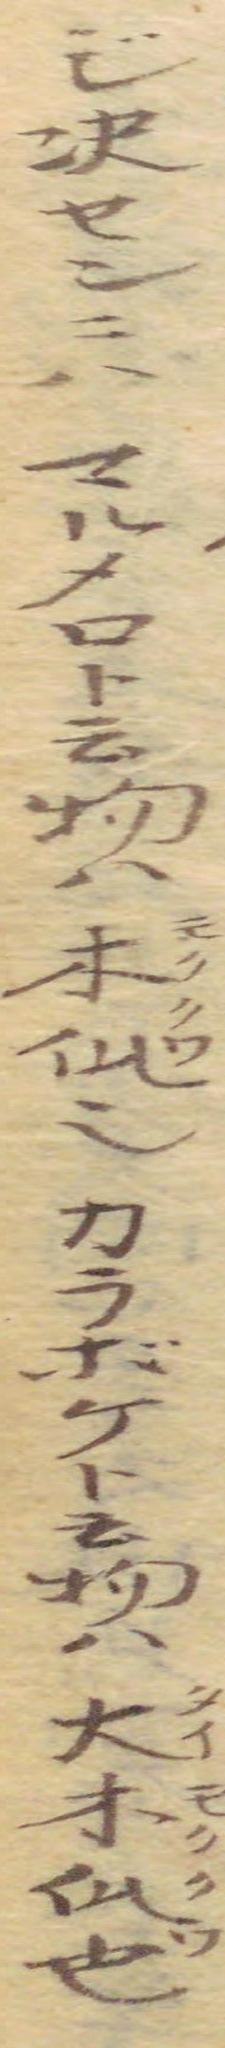ジ決センニハマルメロト云物ハ木瓜也カラボケト云物ハ大木瓜也

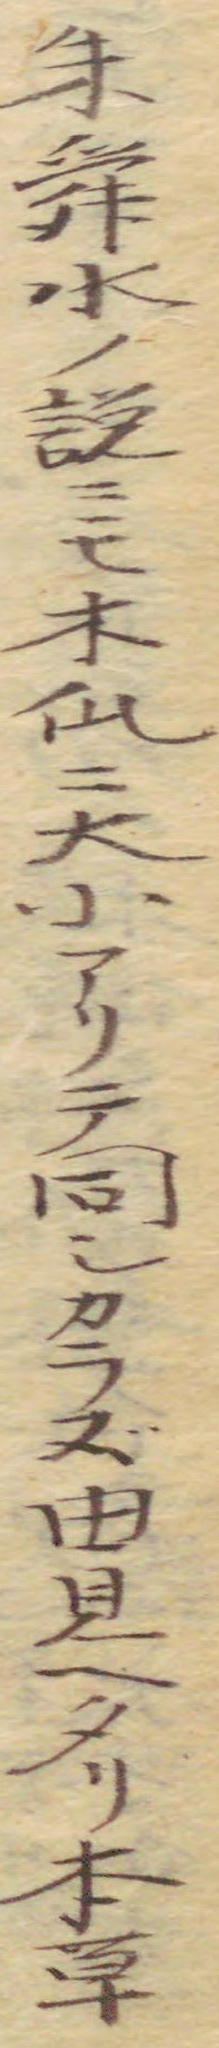朱舜水ノ説ニモ木瓜ニ大アリテ同シカラズ由見ヘタリ本草
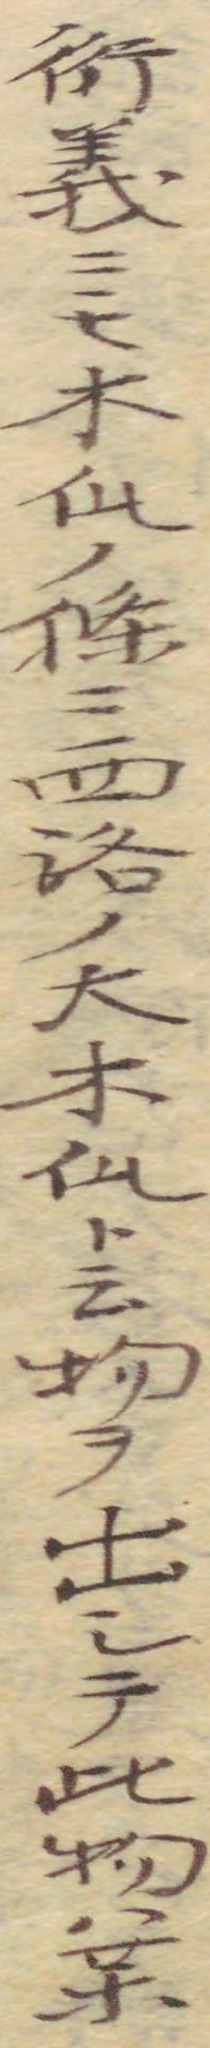衍義ニモ木瓜ノ條ニ西洛ノ大木瓜ト云物ヲ出シテ此物ハ薬
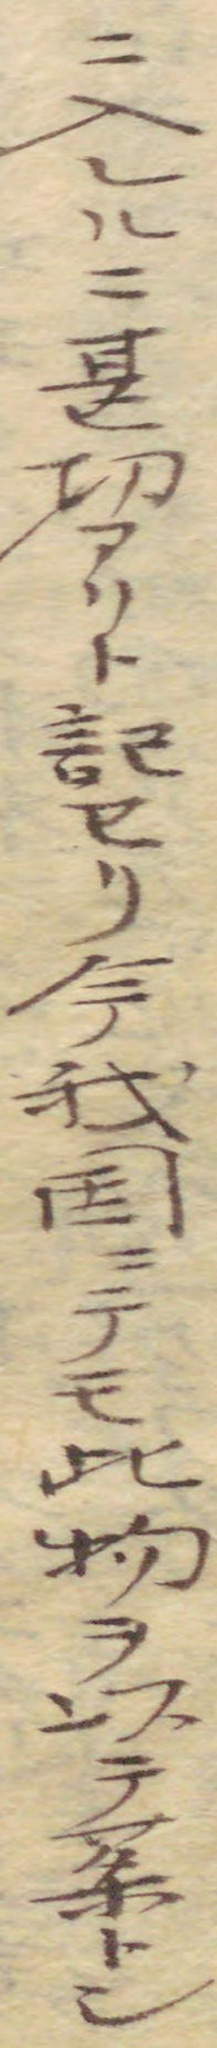ニ入レルニ甚功アリト記セリ今我国ニテモ此物ヲ以テ薬トシ
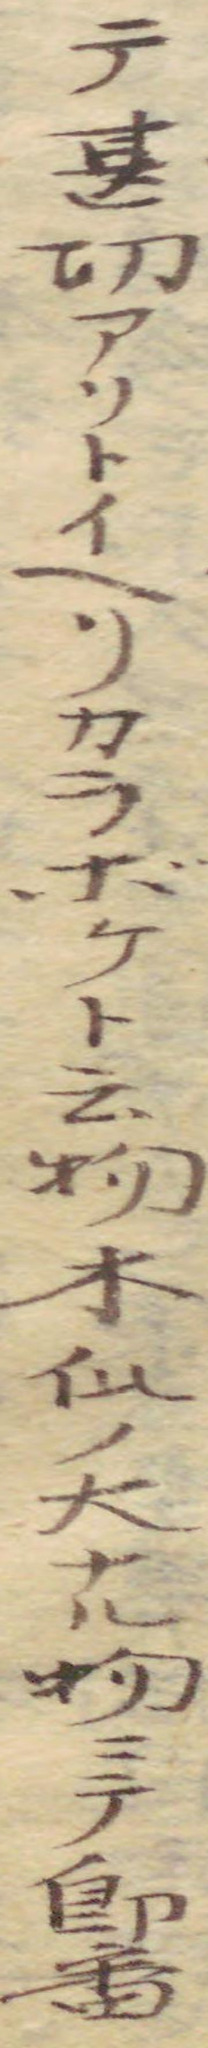テ甚功アリトイヘリカラボケト云物木瓜ノ大ナル物ニテ即番
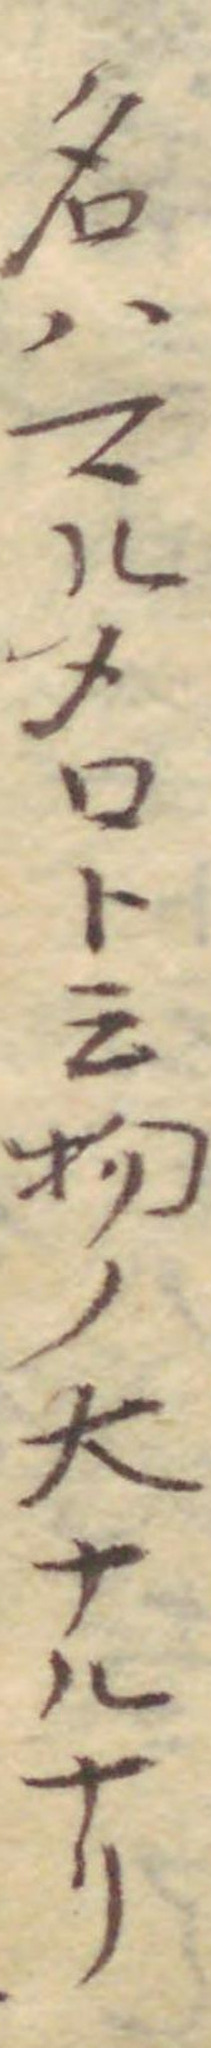名ハマルメロト云物ノ大ナルナリ
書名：鶯宿雑記. 巻263-264
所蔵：国立国会図書館 National Diet Library, JAPAN
